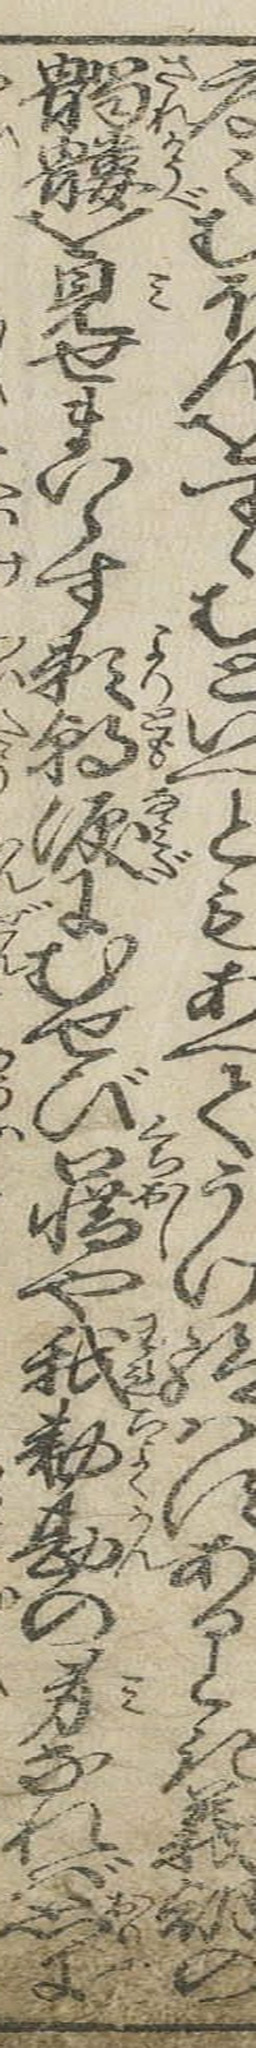髑髏を見せまいらす頼朝涙にむせび口惜や我勅勘の身なれば思に
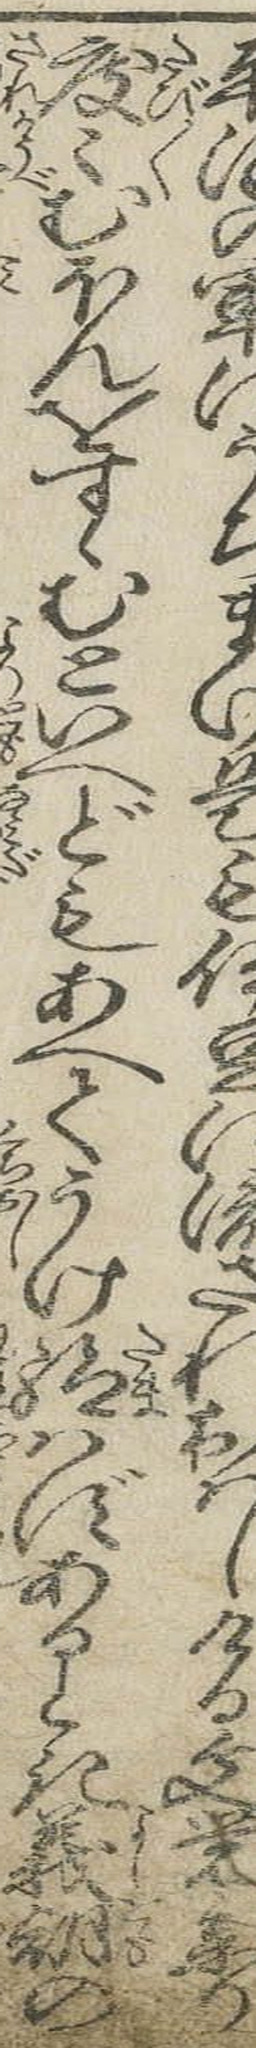度々むほんをすゝむといへどもあへてうけ給はずあるとき義朝の
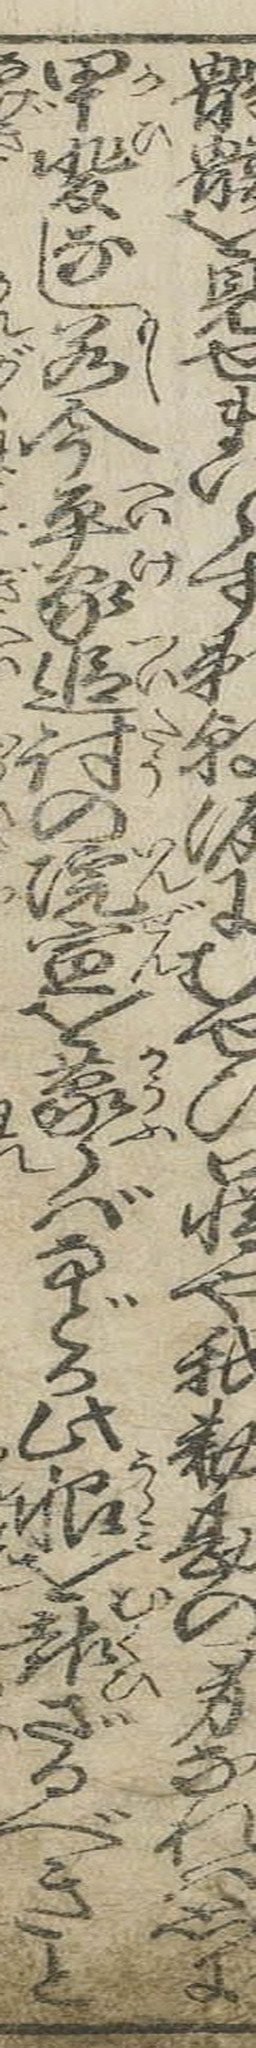甲斐なし若今平家追討の院宣を蒙らばなどか此恨を報ざるべきと
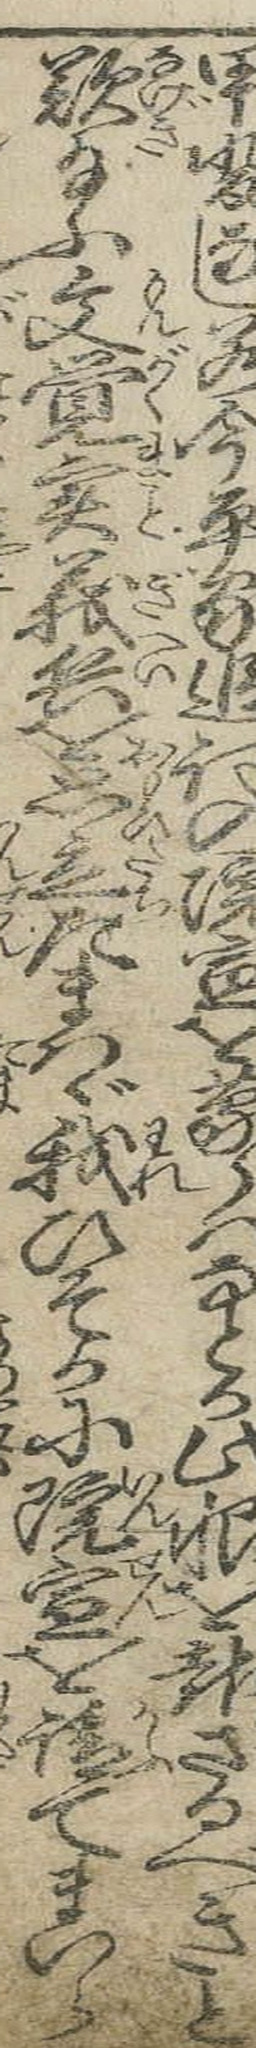歎給ふ文覚実義兵を思立たまはゞ我ひそかに院宣を請てまいら
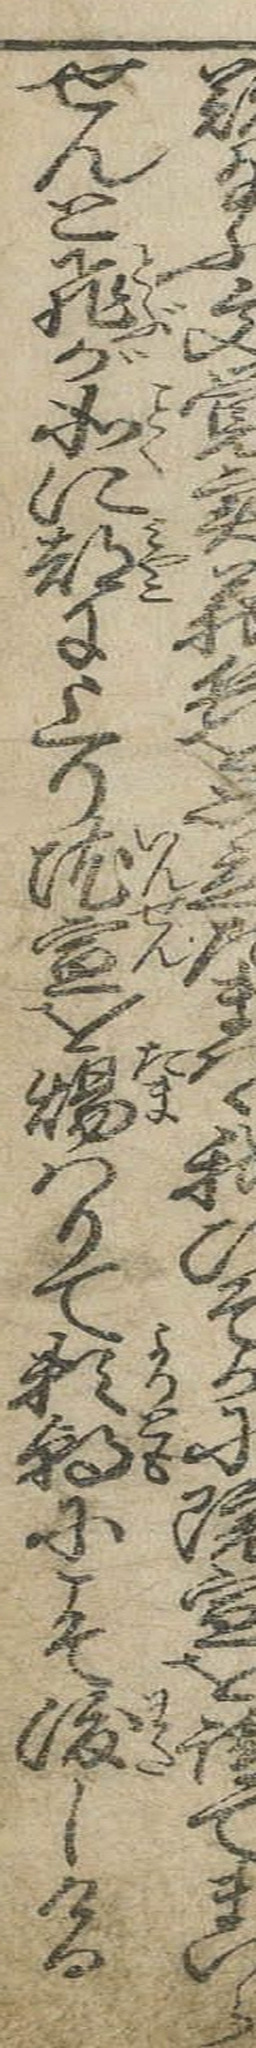せんと飛が如に都に上り院宣を賜はりて頼朝にこそ渡しける

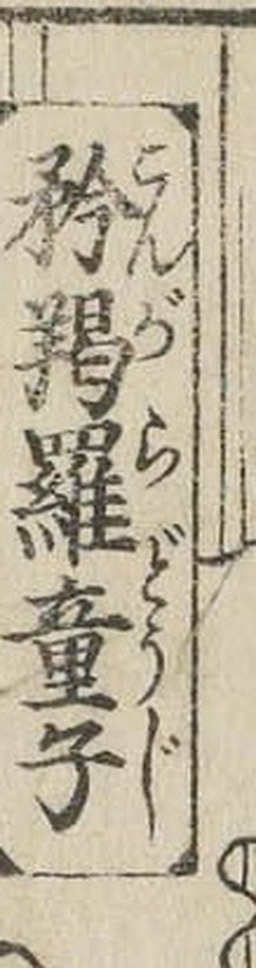矜羯羅童子
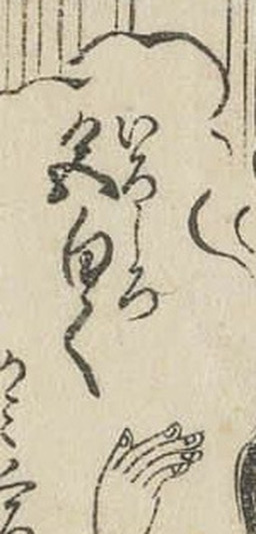色白く
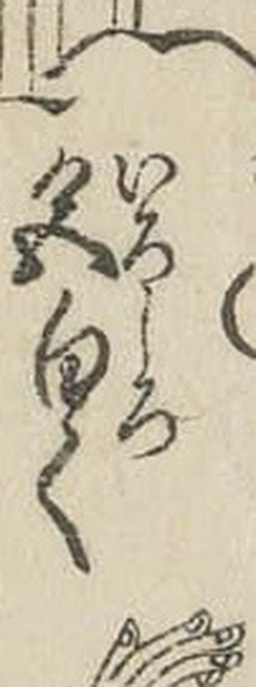色白く
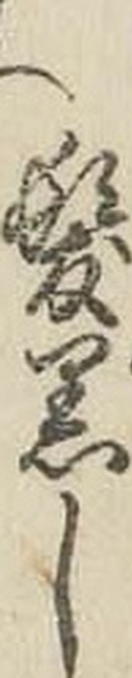髪黒し
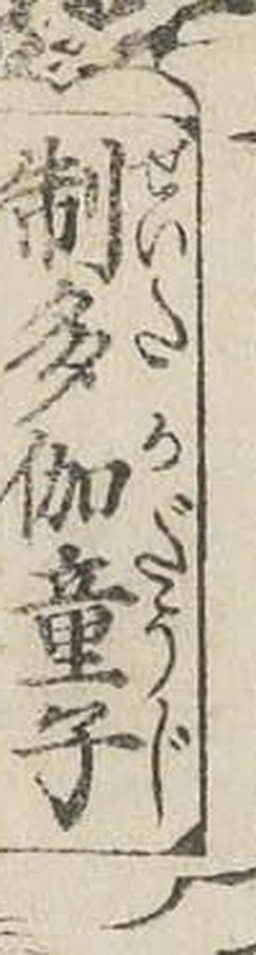制多伽童子
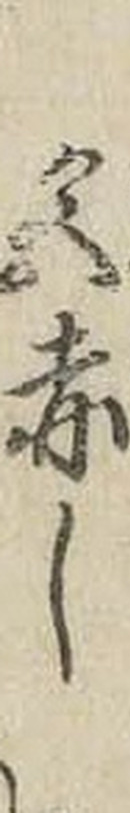色赤し

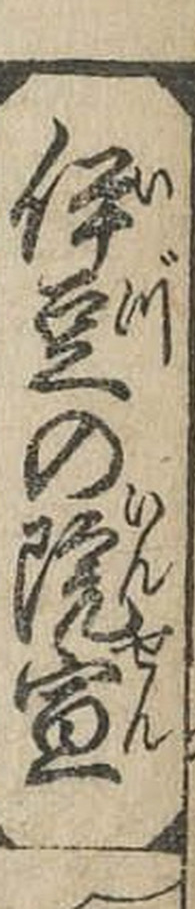伊豆の院宣
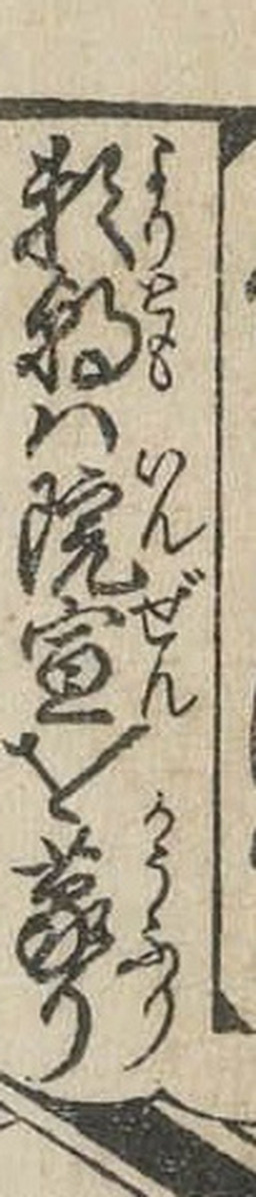頼朝は院宣を蒙り
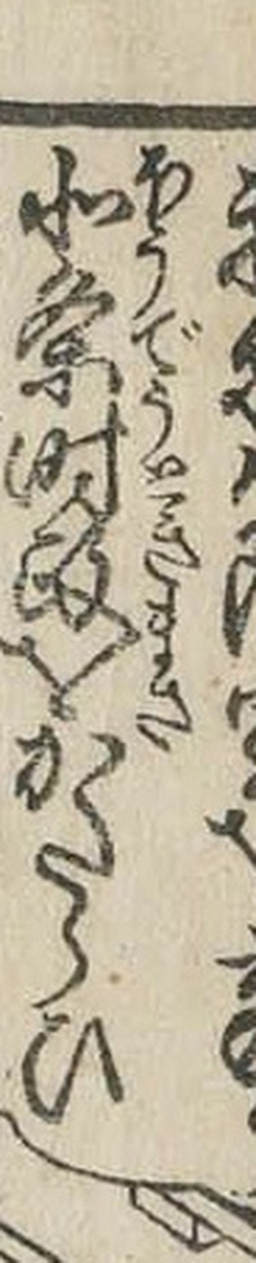北条時政をかたらひ
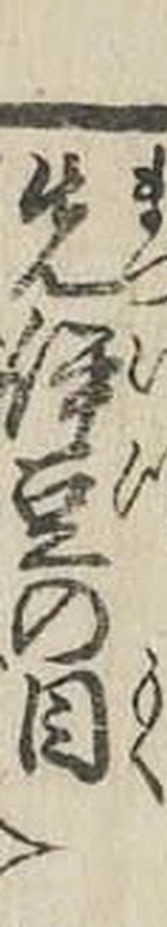先伊豆の目
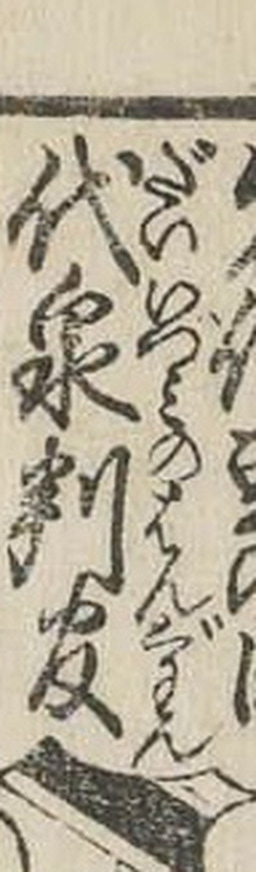代泉判官
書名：絵本写宝袋 9巻 3之巻
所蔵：東京学芸大学教育コンテンツアーカイブ
